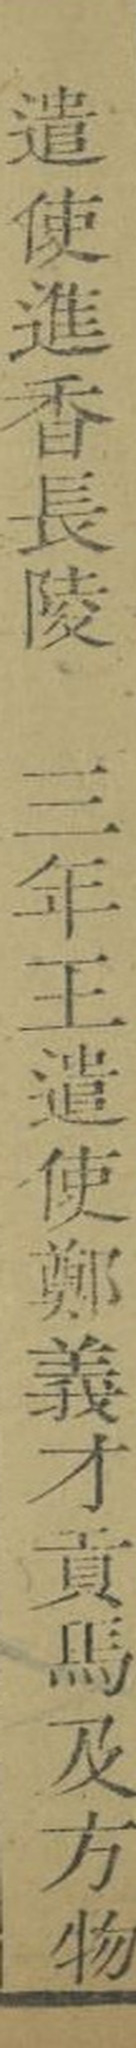遣使進香長陵三年王遣使鄭義才貢馬及方物
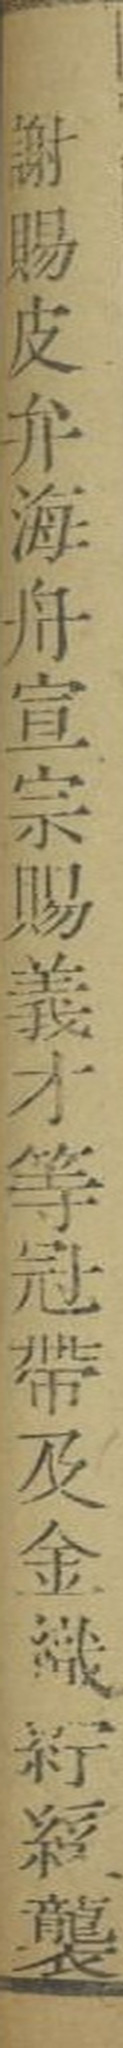謝賜皮弁海舟宣宗賜義才等冠帯及金織紵糸襲
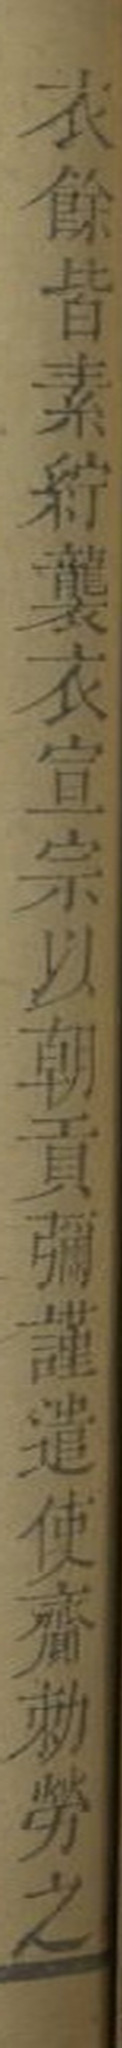衣余皆素紵襲衣宣宗以朝貢弥謹遣使齎勅労之
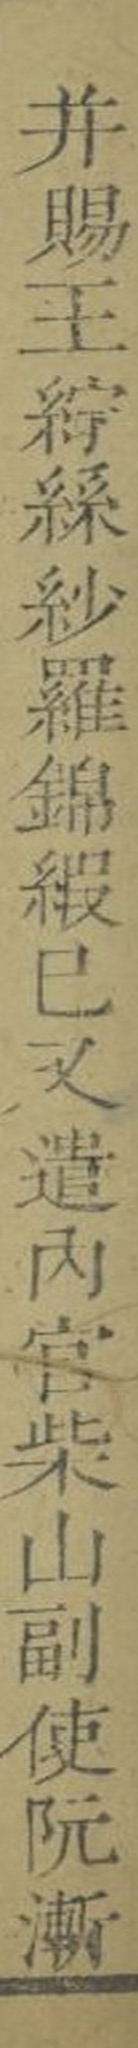并賜王紵糸紗羅錦緞巳又遣内官柴山副使阮漸
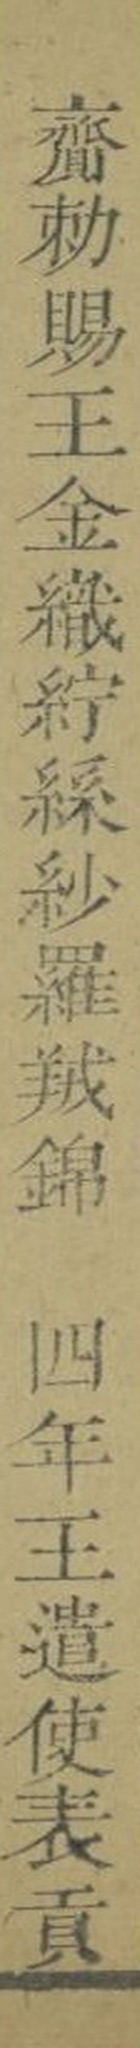齎勅賜王金織紵糸紗羅羢錦四年王遣使表貢
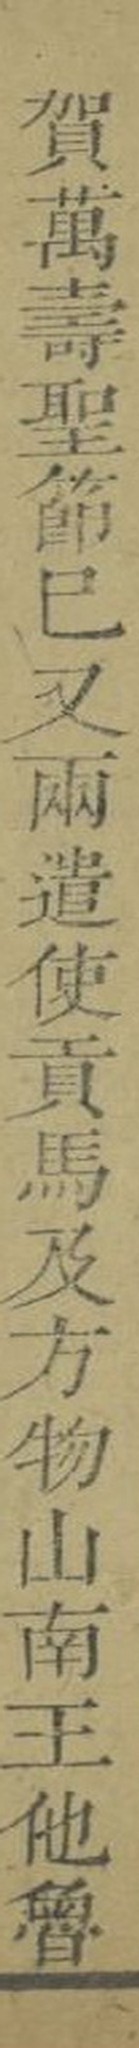賀万寿聖節巳又両遣使貢馬及方物山南王他魯
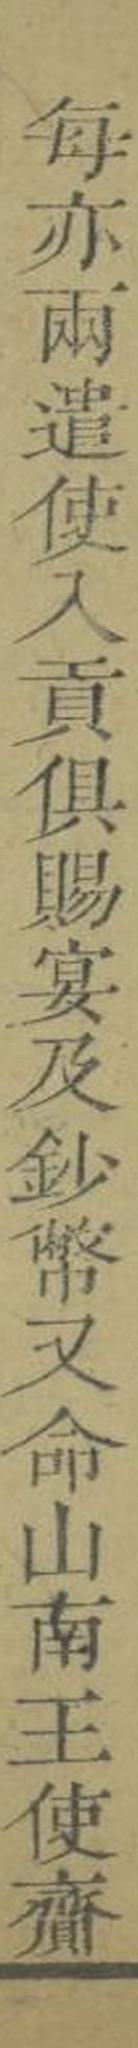毎亦両遣使入貢俱賜宴及鈔幣又命山南王使齎
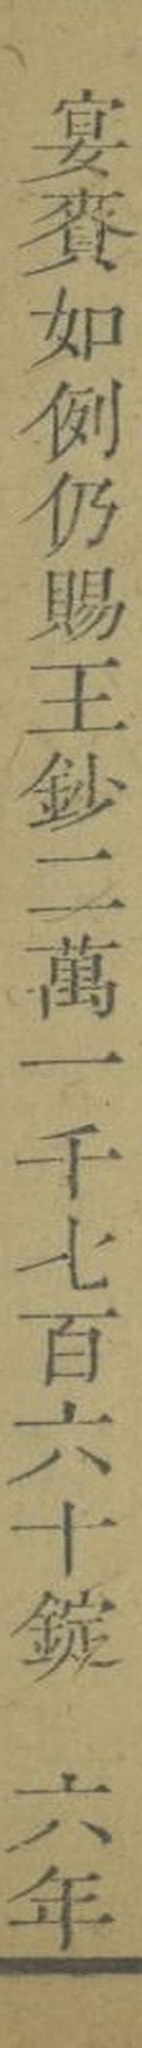宴賚如例仍賜王鈔二万一千七百六十錠六年
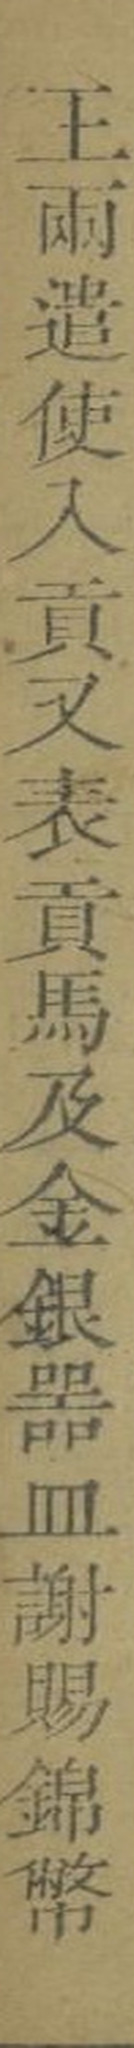王両遣使入貢又表貢馬及金銀器皿謝賜錦幣

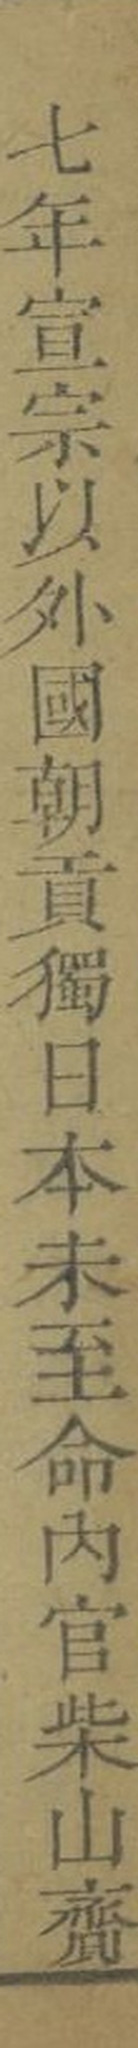七年宣宗以外国朝貢独日本未至命内官柴山齎
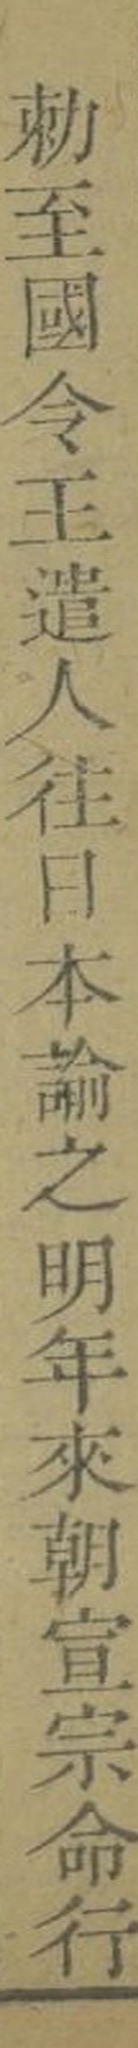勅至国令王遣人往日本諭之明年来朝宣宗命行
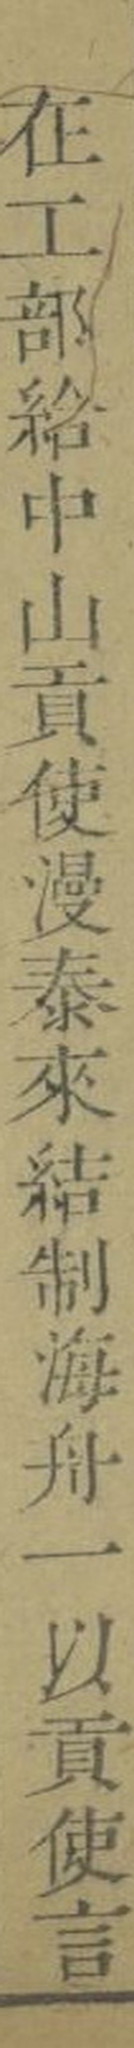在工部給中山貢使漫泰来結制海舟一以貢使言
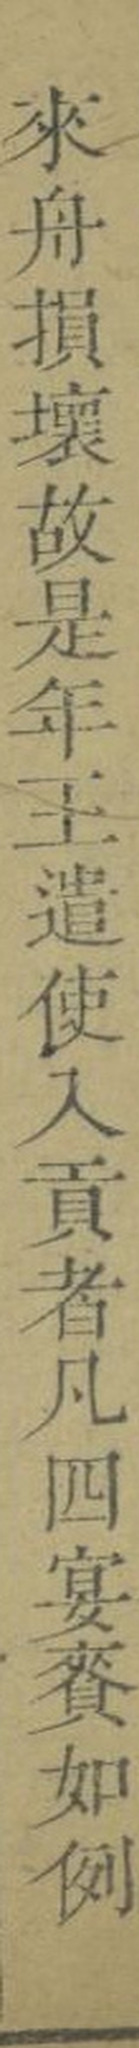来舟損壊故是年王遣使入貢者凡四宴賚如例
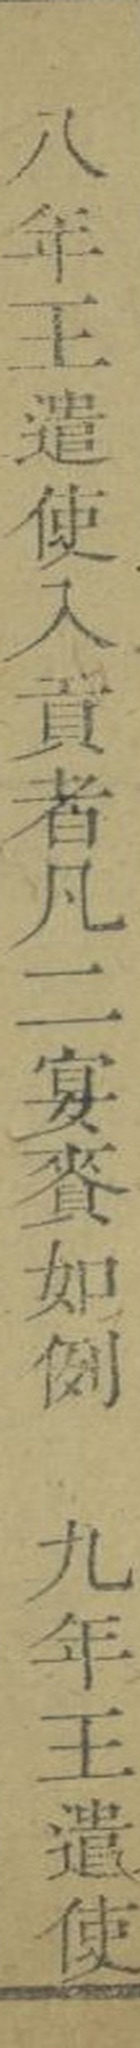八年王遣使入貢者凡二宴賚如例九年王遣使
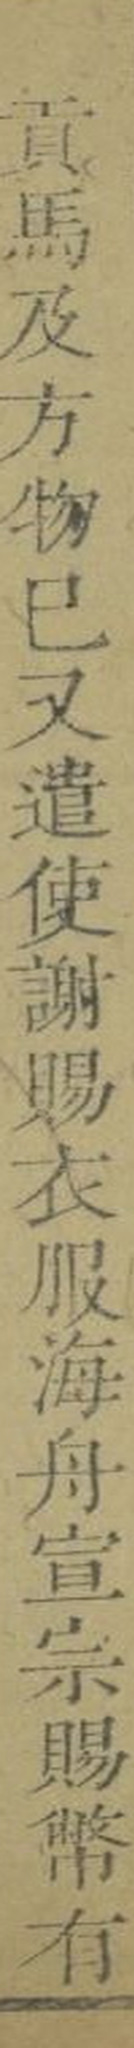貢馬及方物巳又遣使謝賜衣服海舟宣宗賜幣有
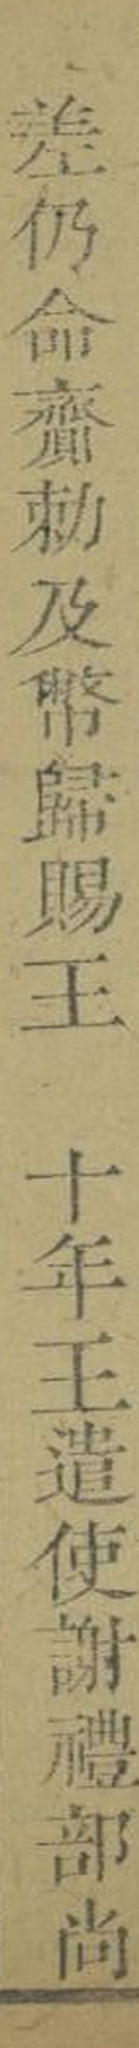差仍命齎勅及幣帰賜王十年王遣使謝礼部尚
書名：中山伝信録 巻三
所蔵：University of the Ryukyus Library
